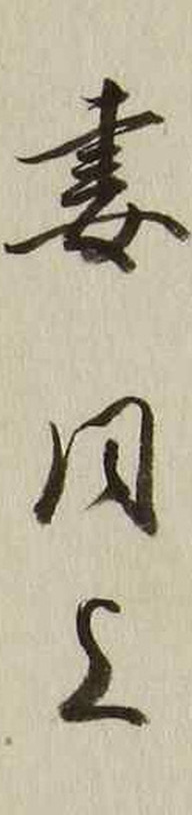妻同上
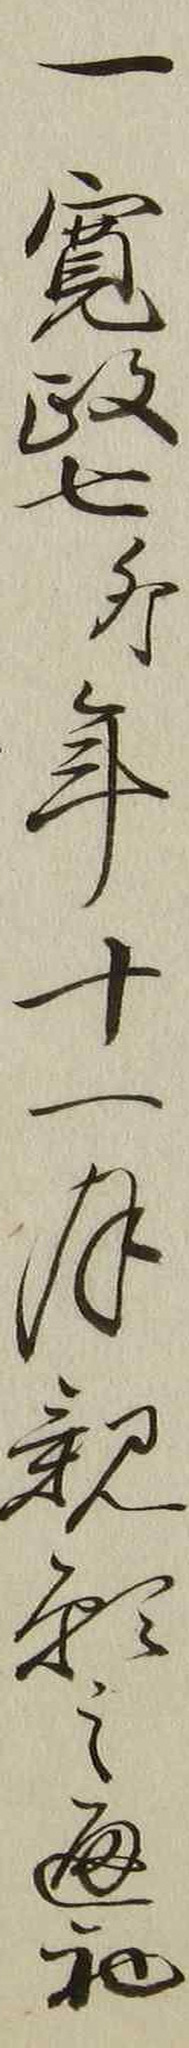一寛政七卯年十一月親願之通初
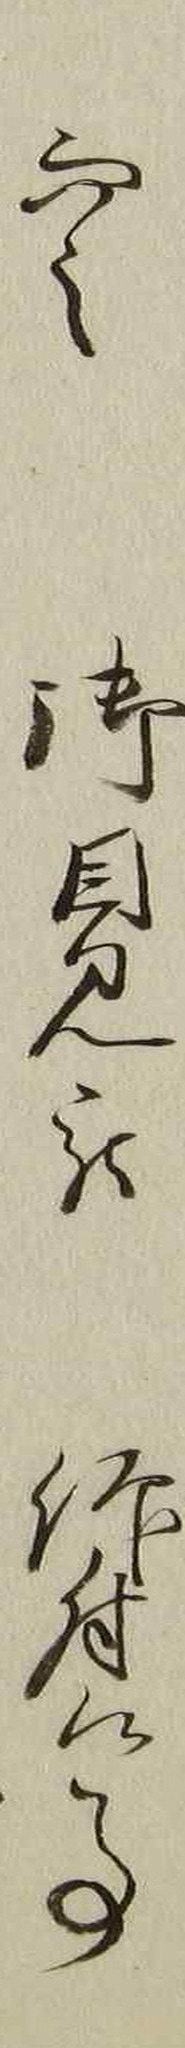而之御目見被仰付候事
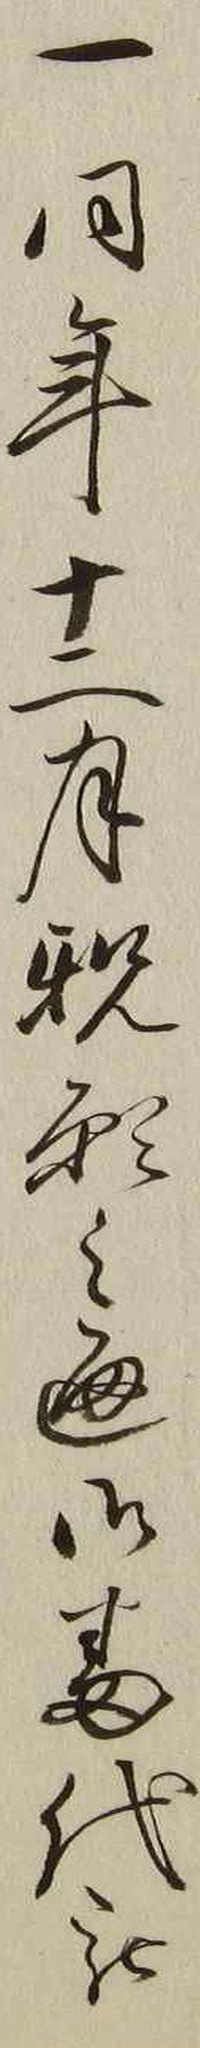一同年十二月親願之通御番代被
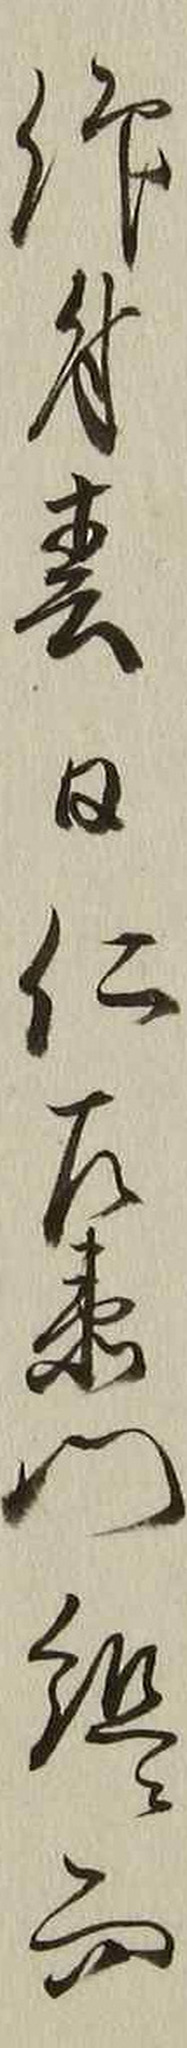仰付春日仁左衛門組ニ而
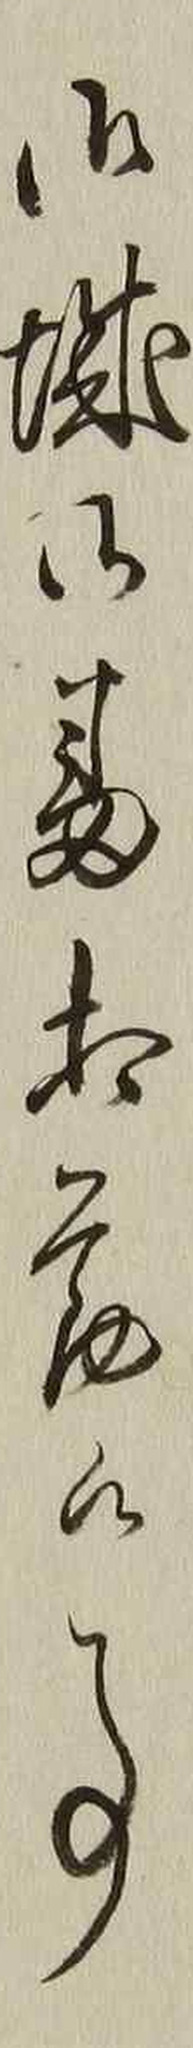御城御番相勤候事
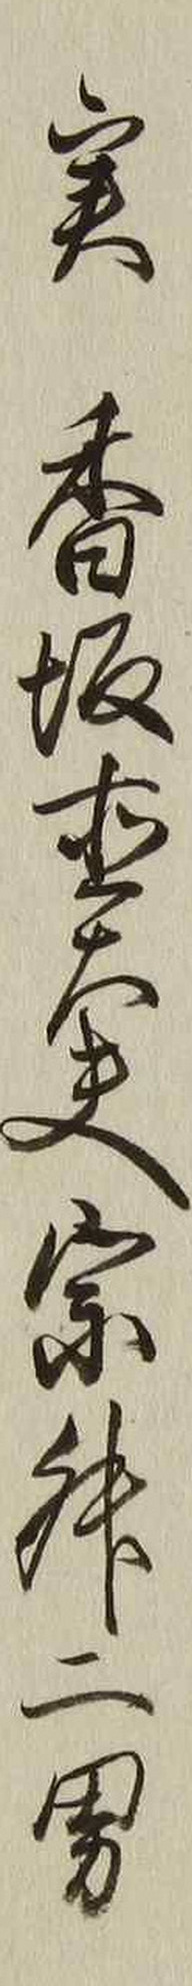実香坂直大夫宗舛二男
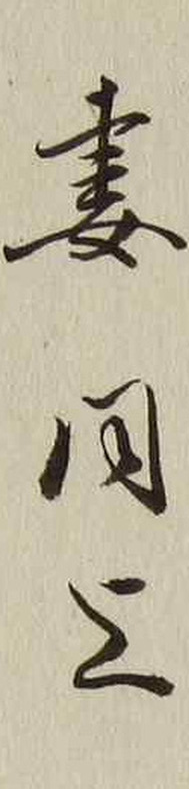妻同上
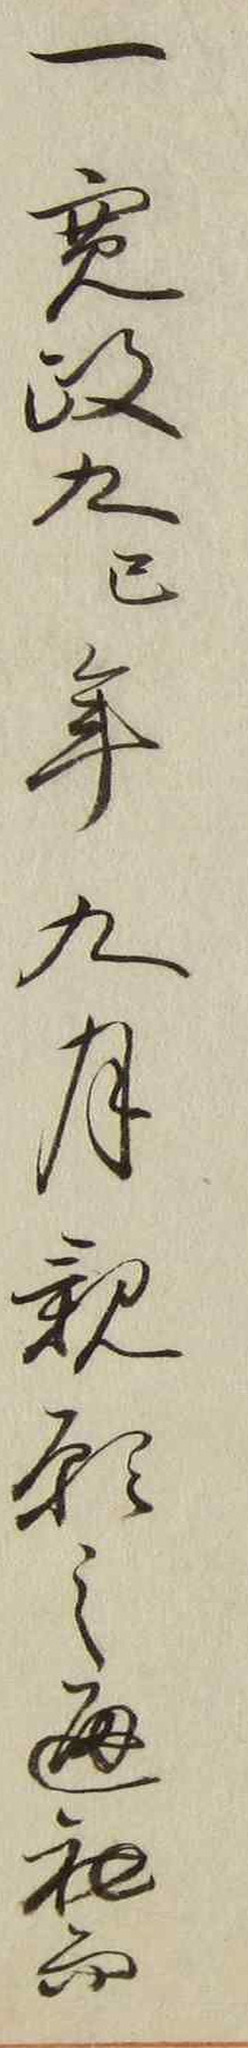一寛政九巳年九月親願之通初而

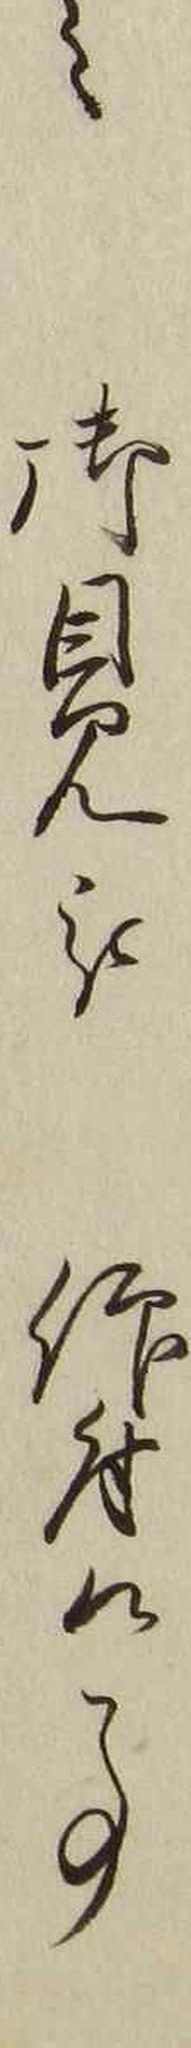之御目見被仰付候事
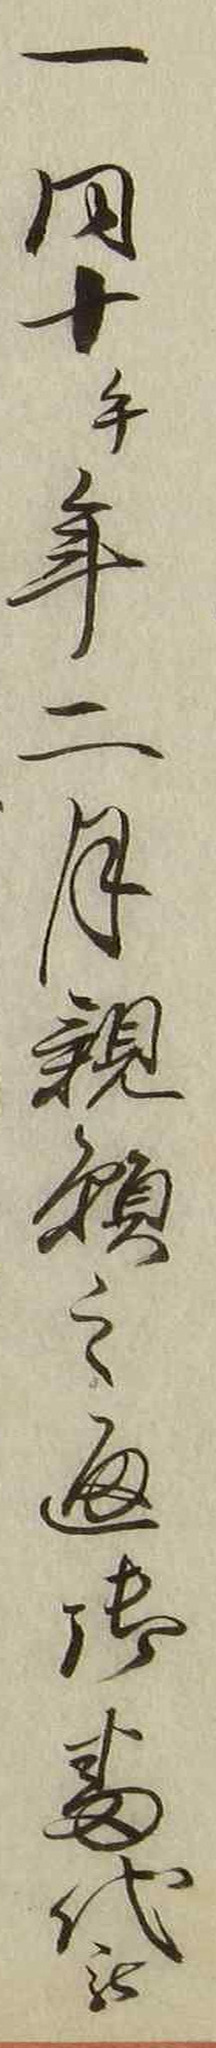一同十午年二月親願之通御番代被
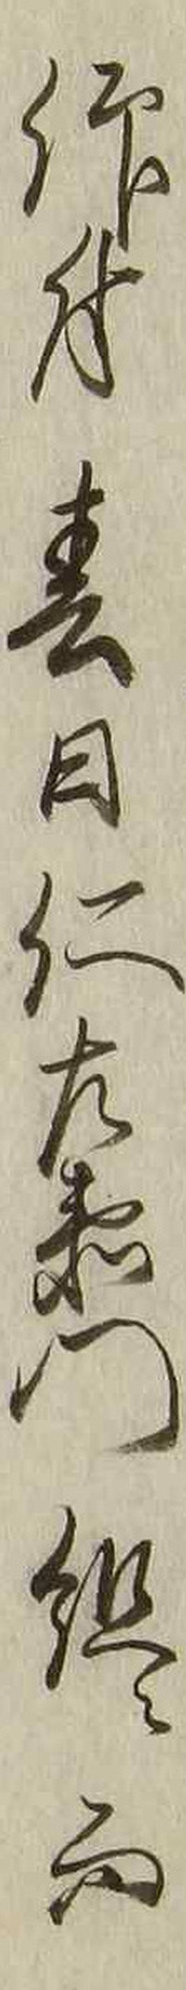仰付春日仁左衛門組ニ而
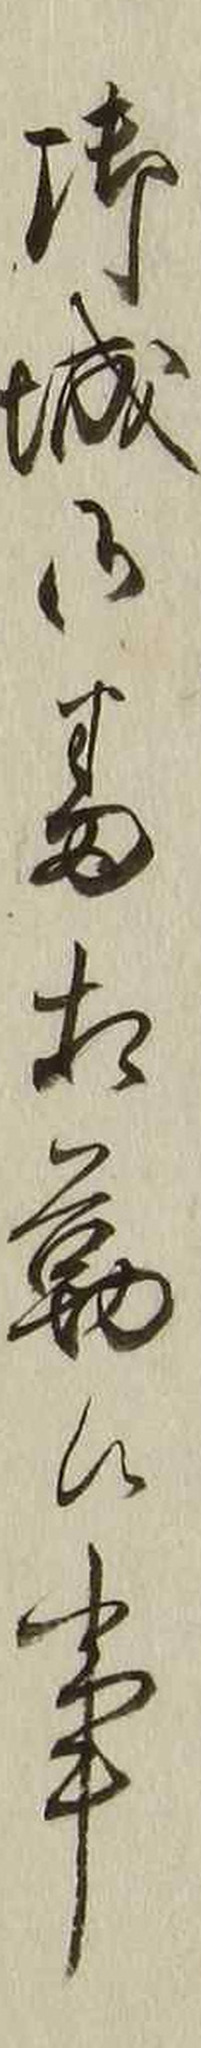御城御番相勤候事
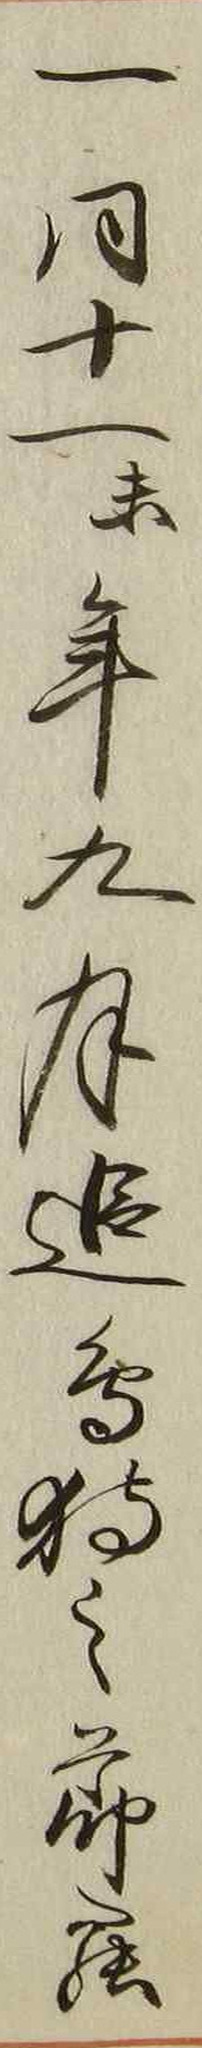一同十一未年く九月追鳥狩之節罷
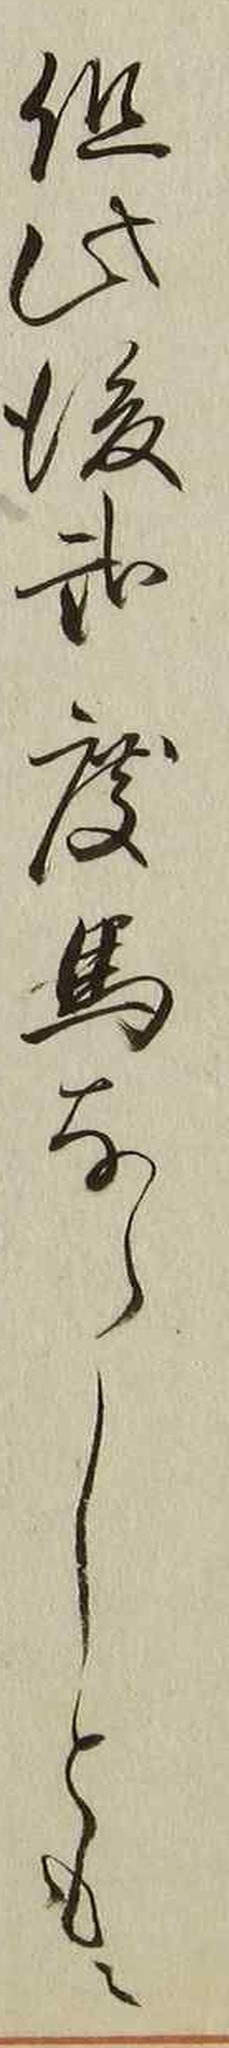但此後弐度馬ならしともニ
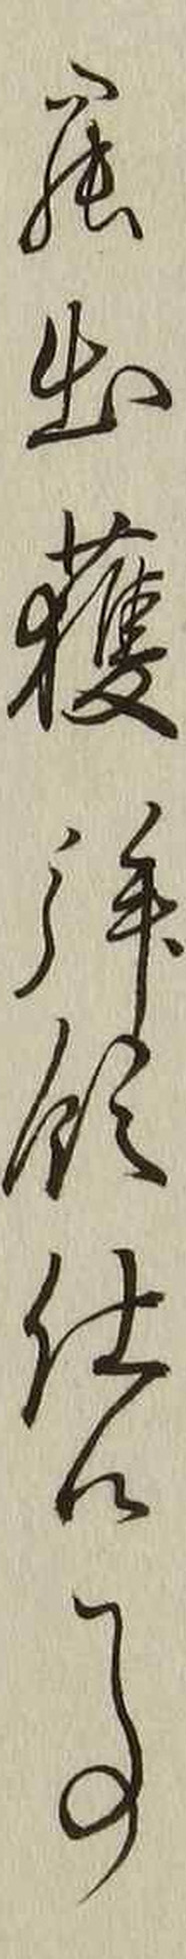罷出獲拝領仕候事
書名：諸士系譜　巻之54　ほ之部1
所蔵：会津若松市立会津図書館
